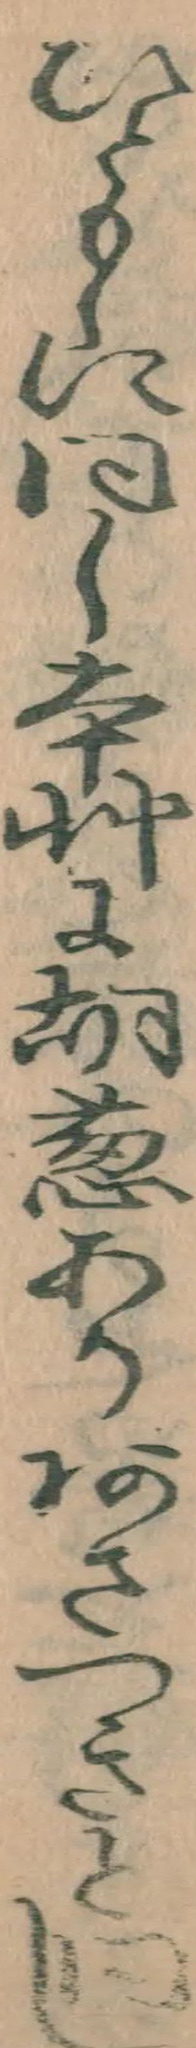ひともしに同し本艸に胡葱ありあさつきと同し
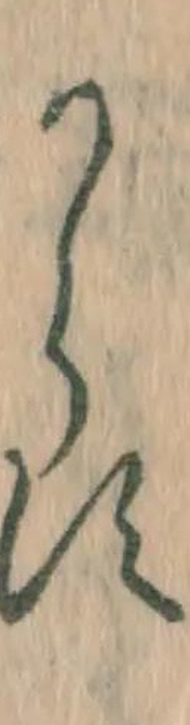からす
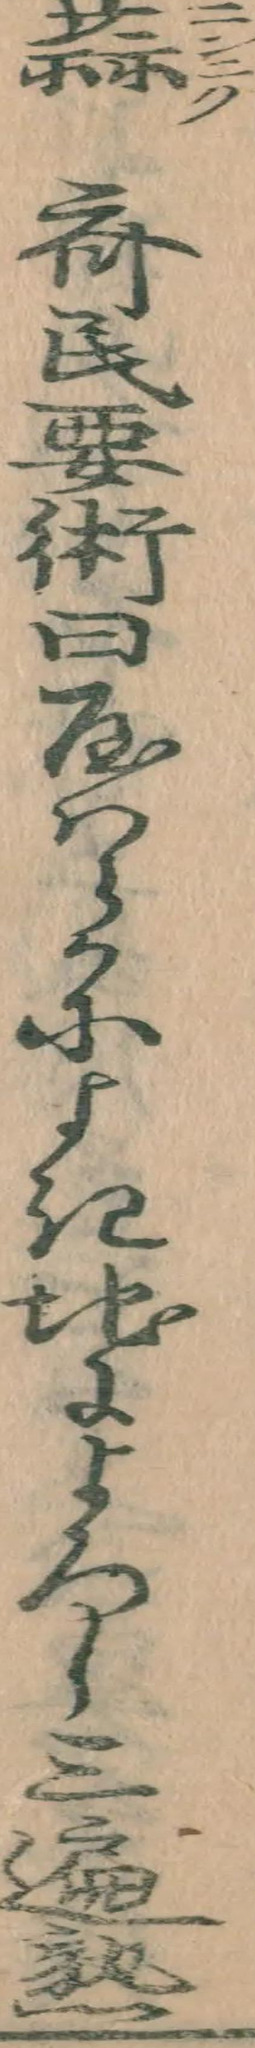蒜斉民要術曰やはらかによき地によろし三遍熟
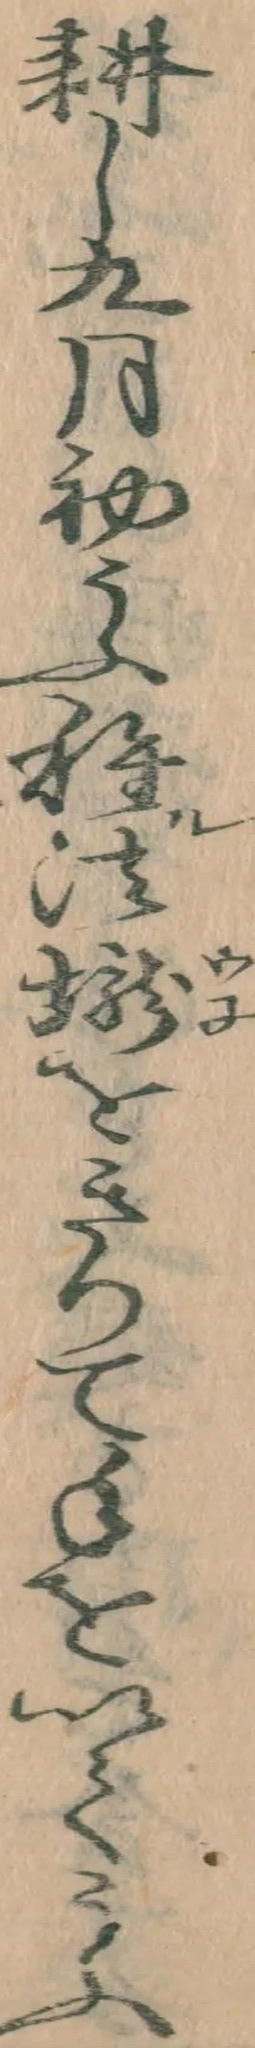耕し九月初うふ種法隴をきりて手を以てうふ
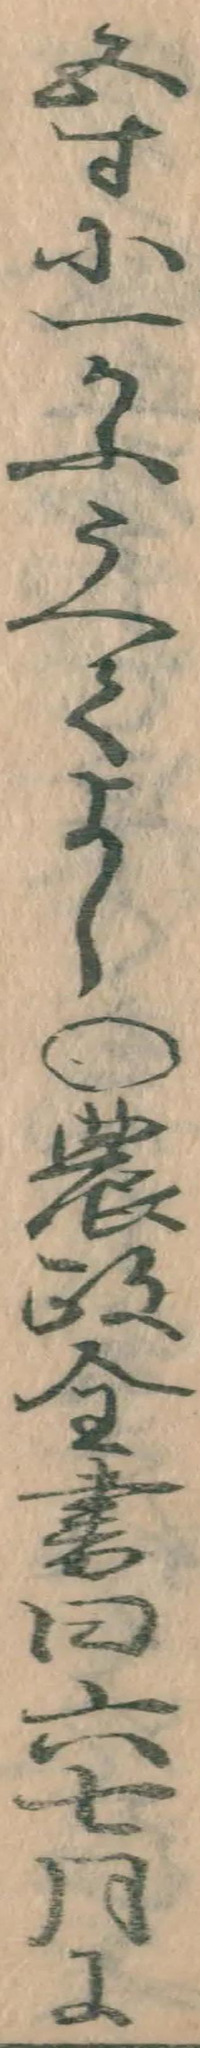五寸に一かふうへてよし〇農政全書曰六七月に
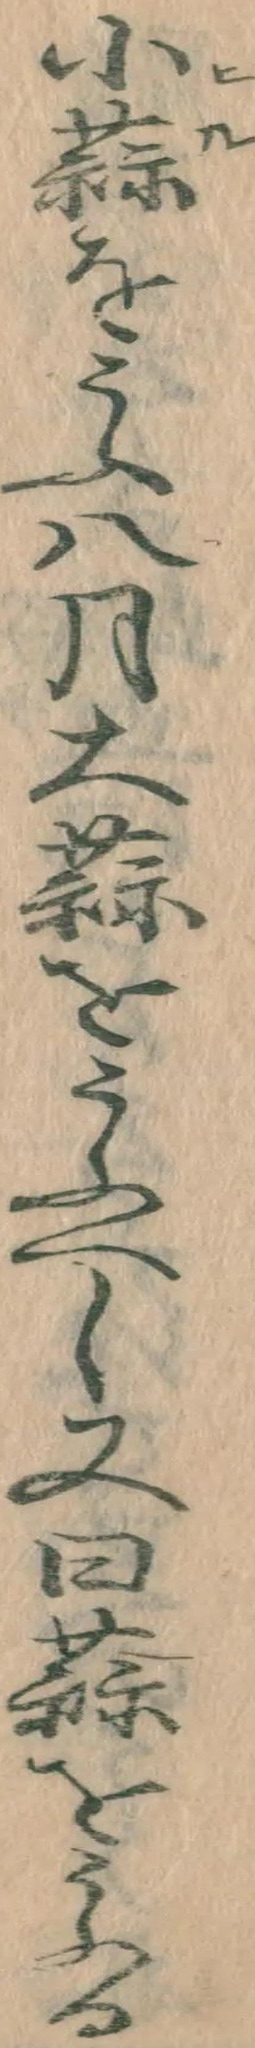小蒜をうふ八月大蒜をうふへし又曰蒜をうふる
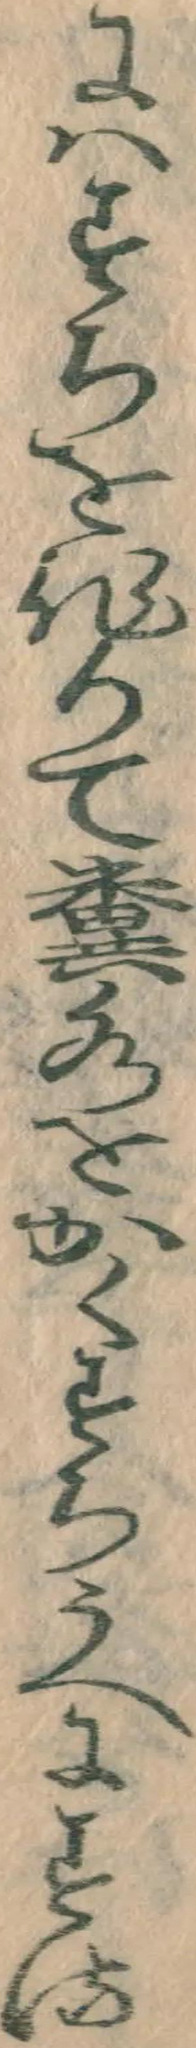にはすちを作りて糞水をかくすちうへにする
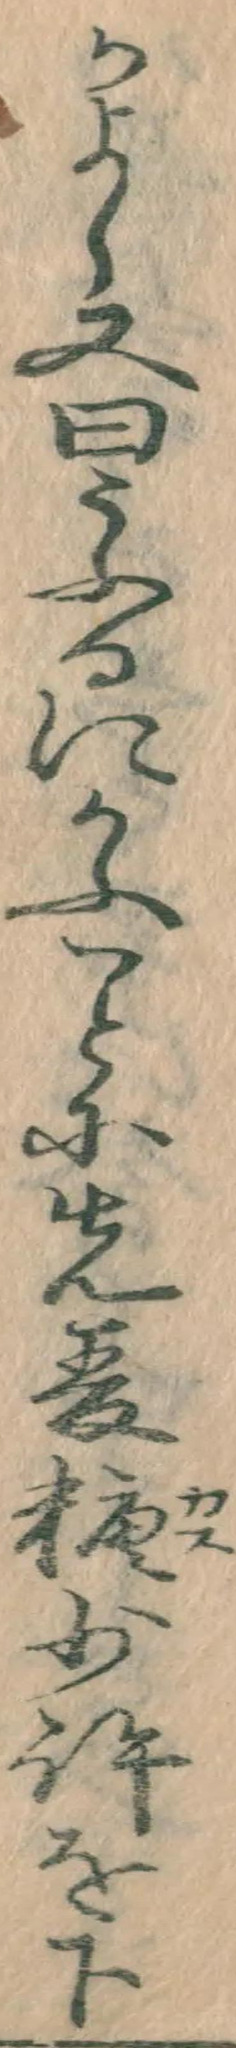かよし又曰うふるにかふことに先麦糖少許を下
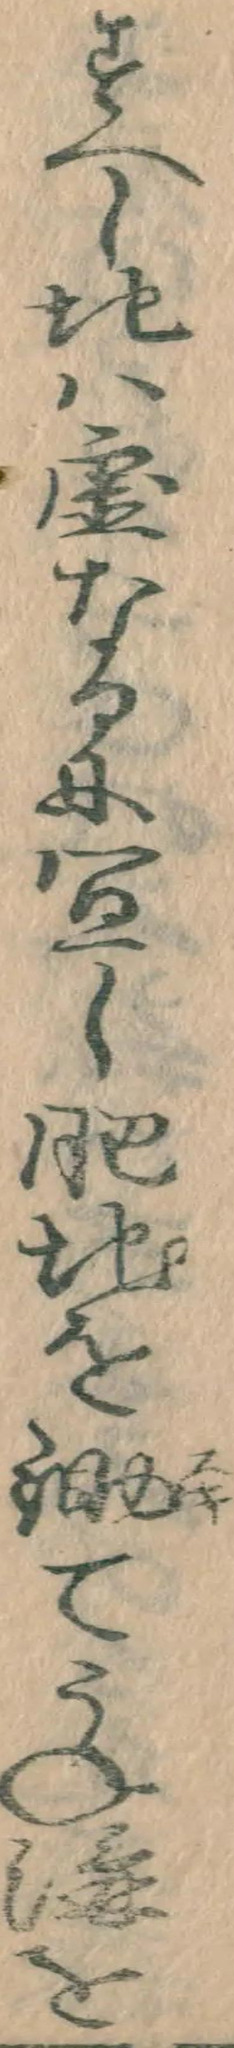すへし地は虚なるに宜し肥地を鋤てうね溝を
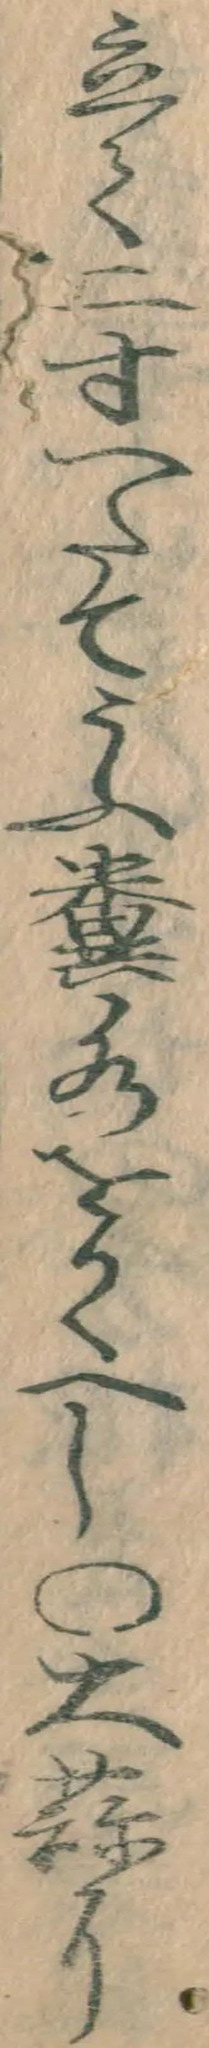立て二寸へたてうふ糞水をかくへし〇大蒜に

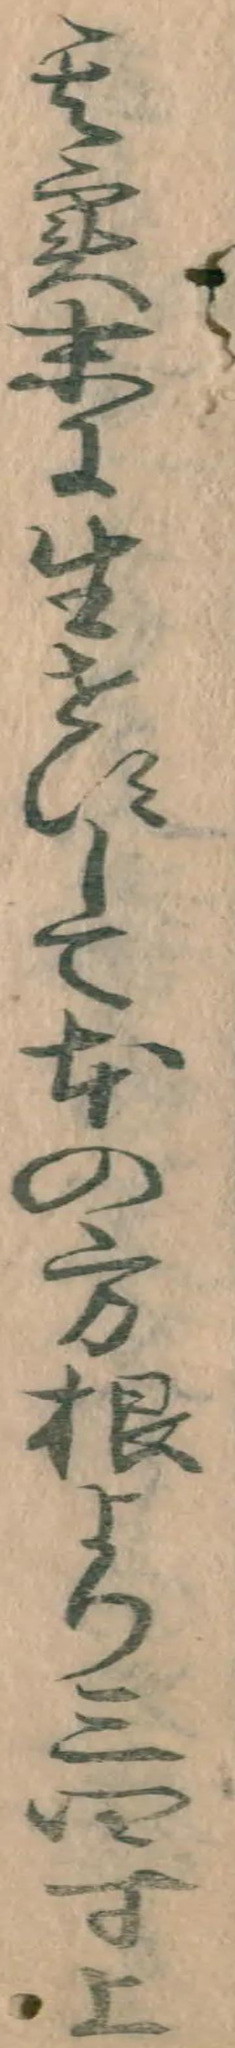其実末に生せすして本の方根より三四寸上
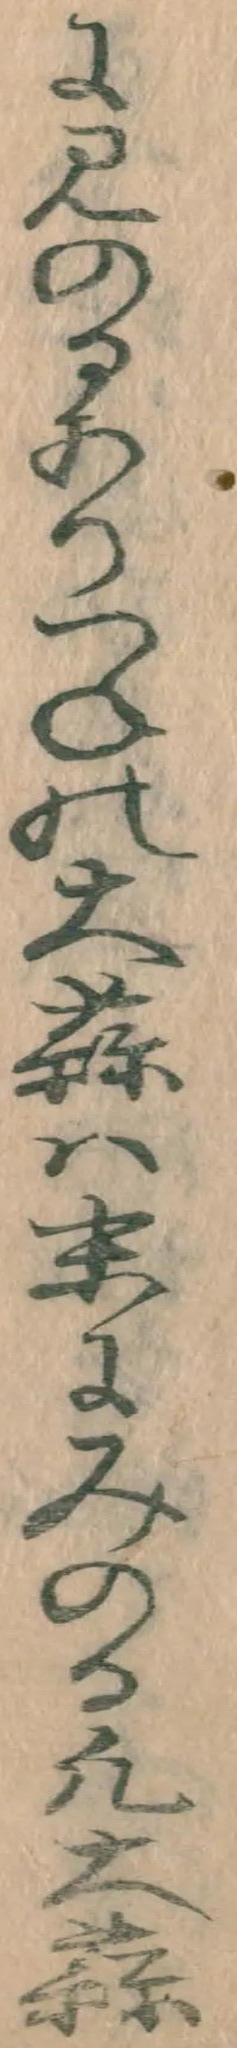にみのるありつねの大蒜は末にみのる凡大蒜
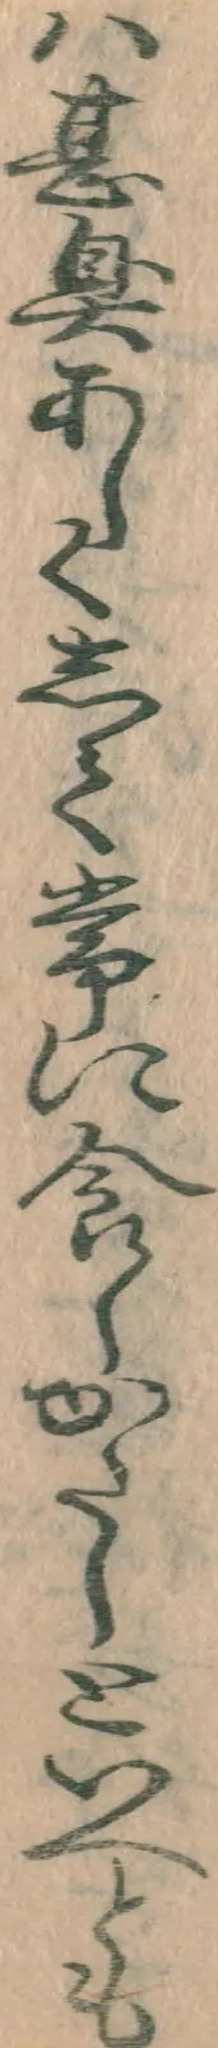は甚臭あしくしてして常に食しかたしといへとも
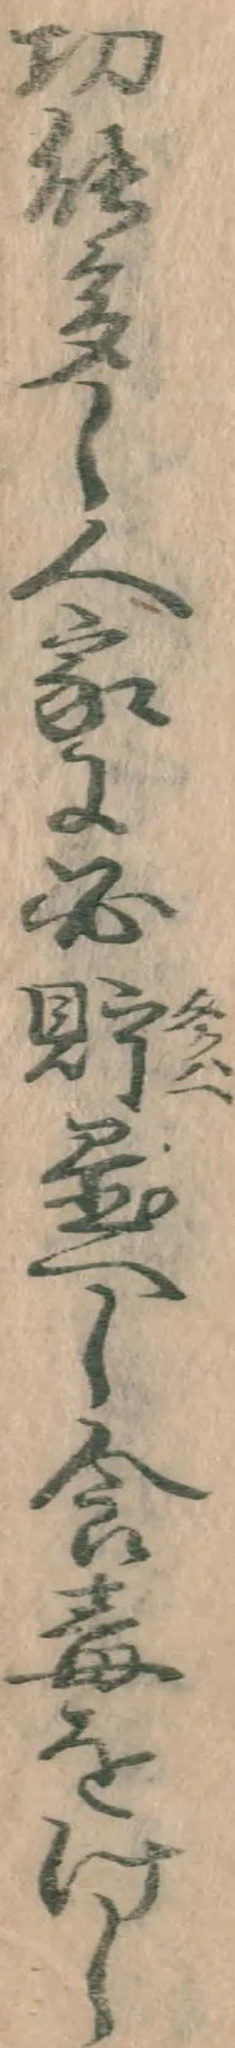効能多し人家に必貯置へし食毒をけし
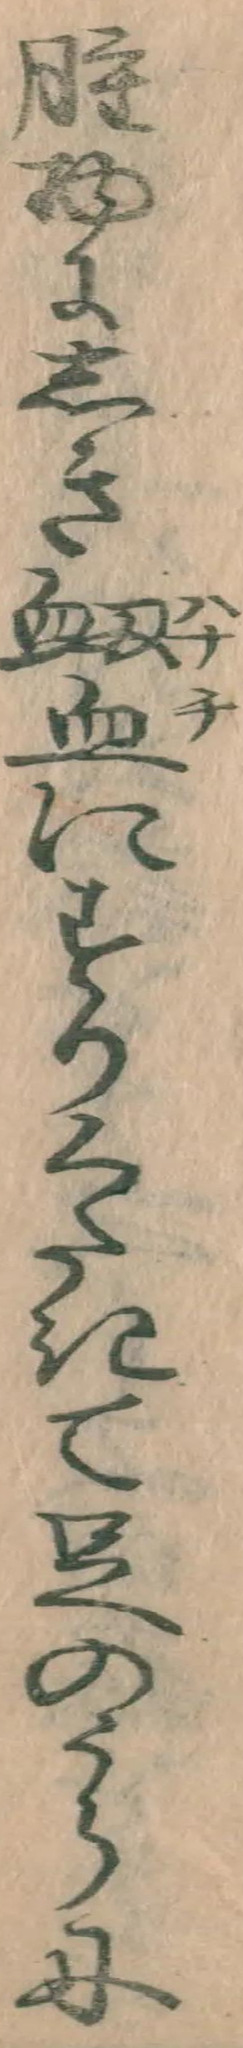腫物にしき衂血にすりくたきて足のうらに
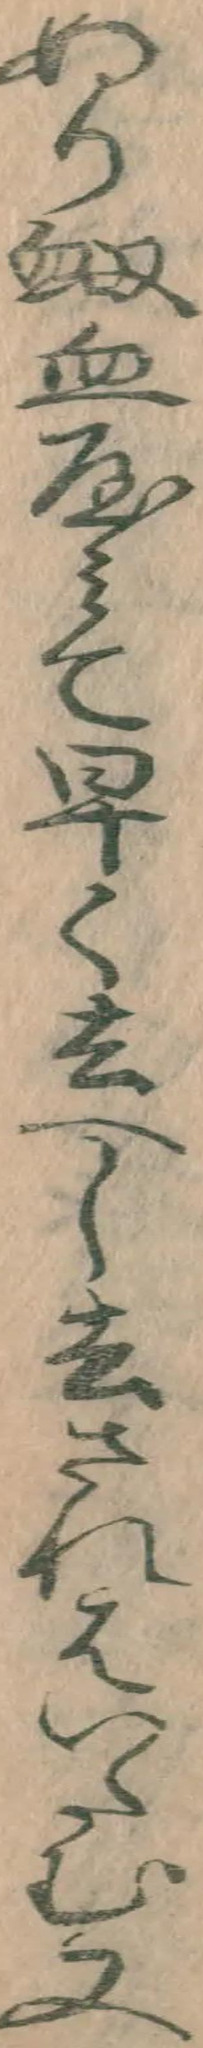ぬり衂血やみて早く去へし去されはいたむ又
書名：菜譜 3巻
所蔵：国立国会図書館 National Diet Library, JAPAN
